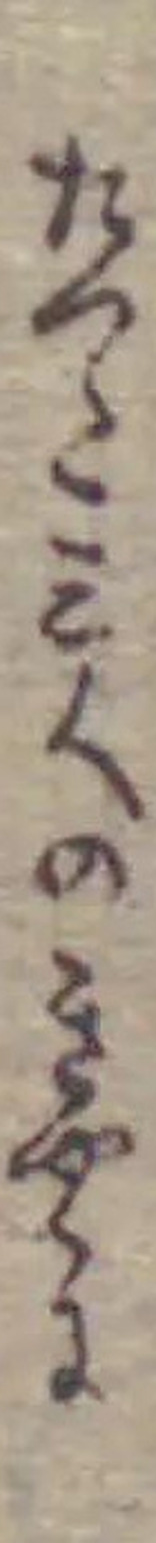たつた三人のきやくに
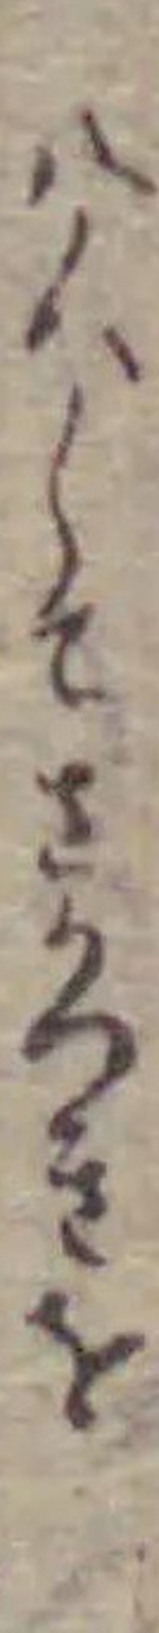八人してさかつきを
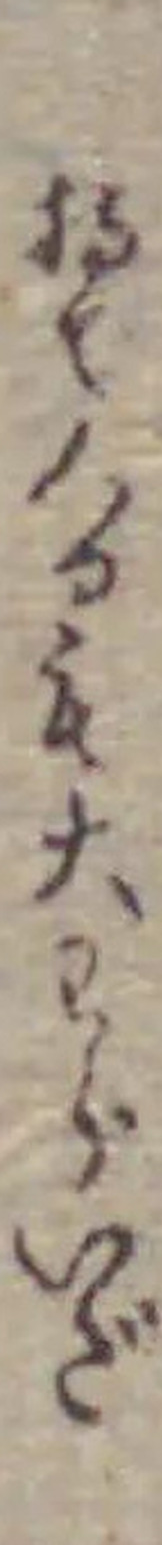持てくるも大わらいだ
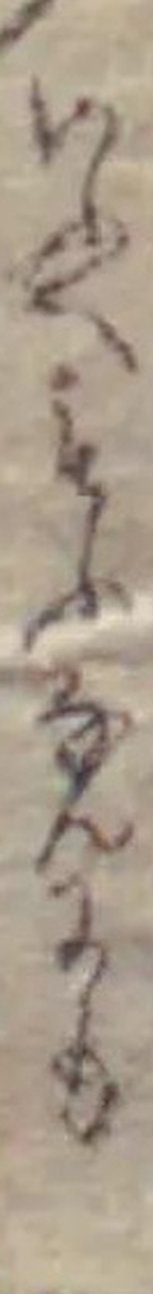いふへもふなんにも
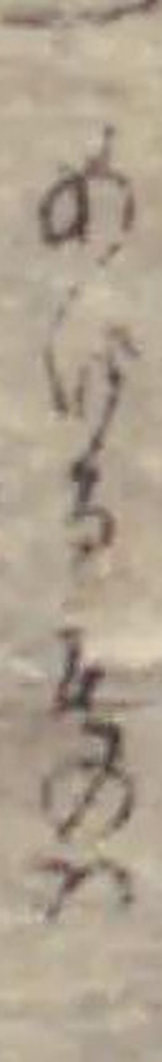あげるものは
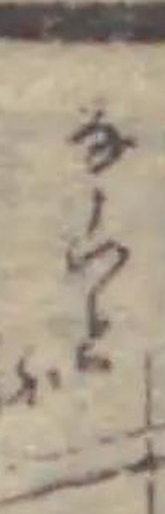なこと
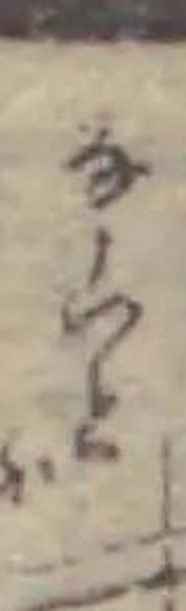なこと
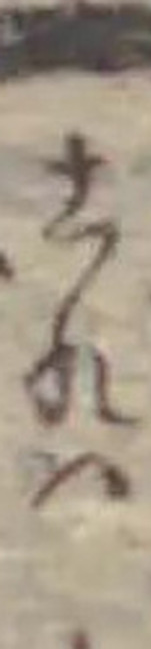これは
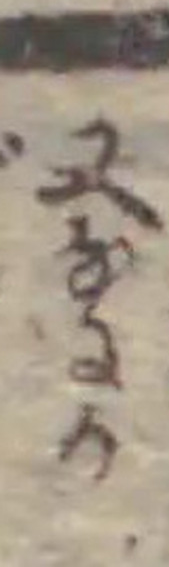又なにか
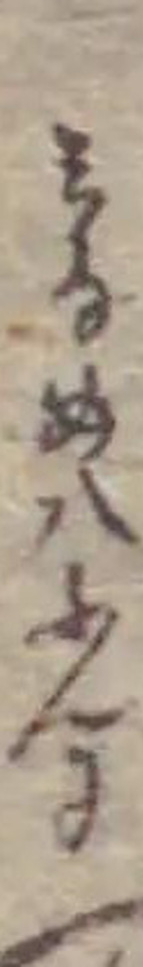みなめ八ぶんに

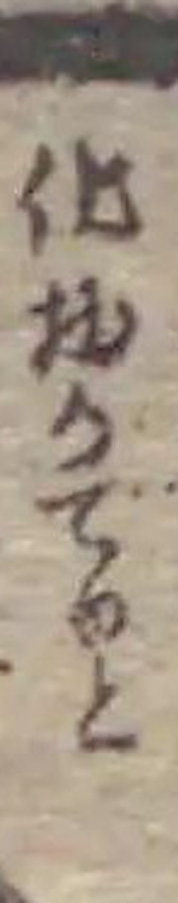化物がでると
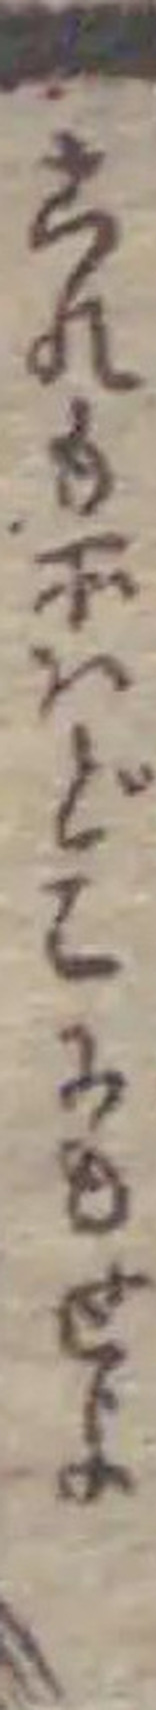これも所はどこにもせよ
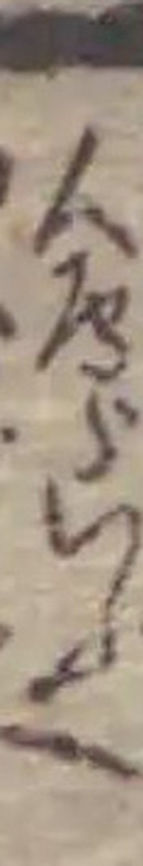人専らいふ
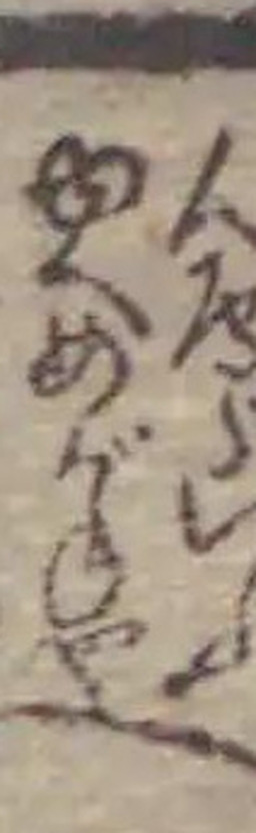ゆへめがねや
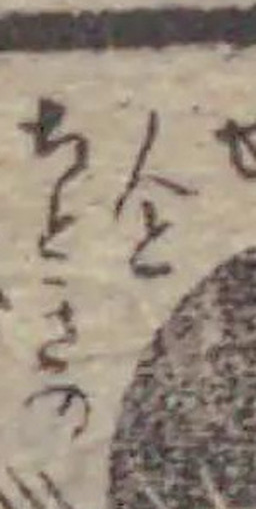ちときの
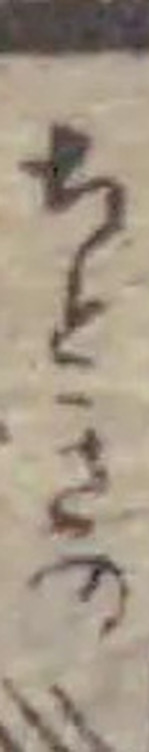ちときの
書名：栄増眼鏡徳 3巻
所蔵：国立国会図書館 National Diet Library, JAPAN
